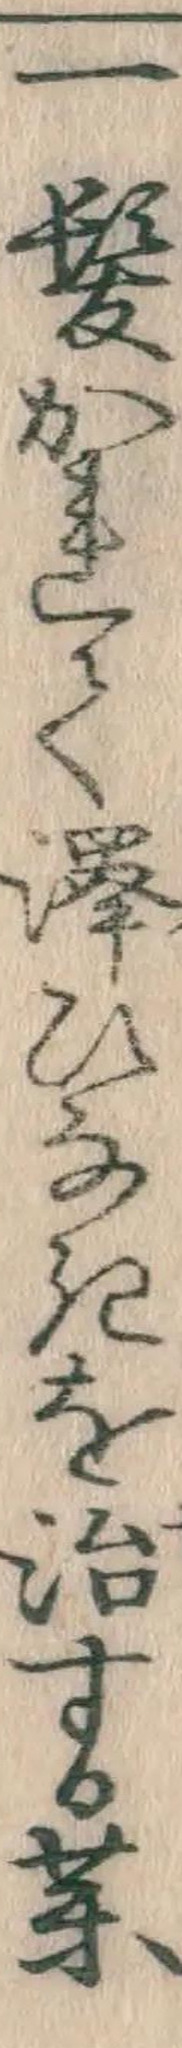一髪かれて澤ひなきを治する薬
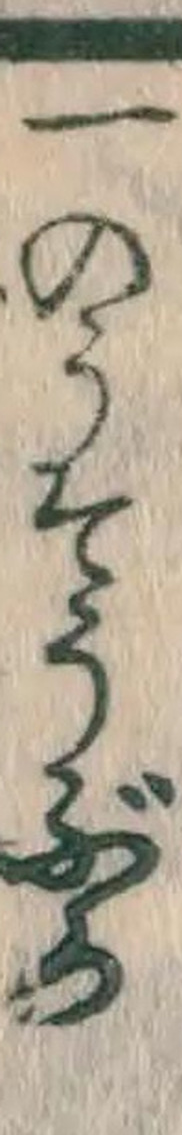一のうそうぶか
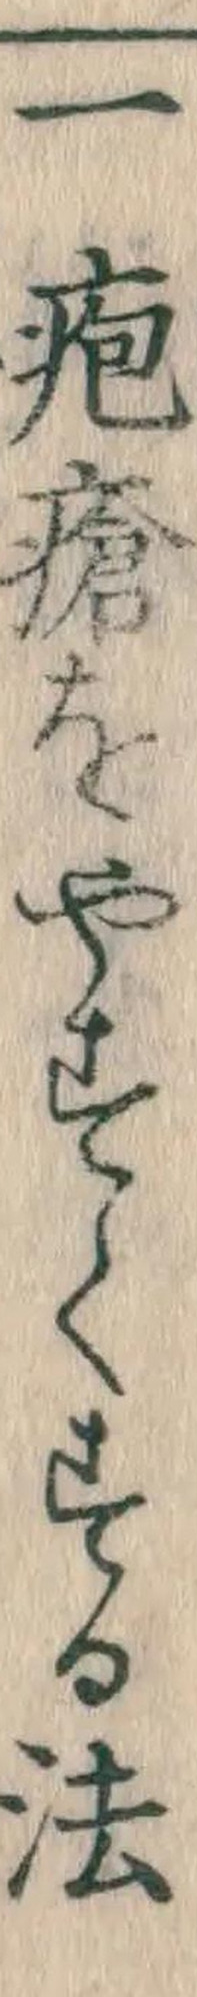一疱瘡をやすくする法
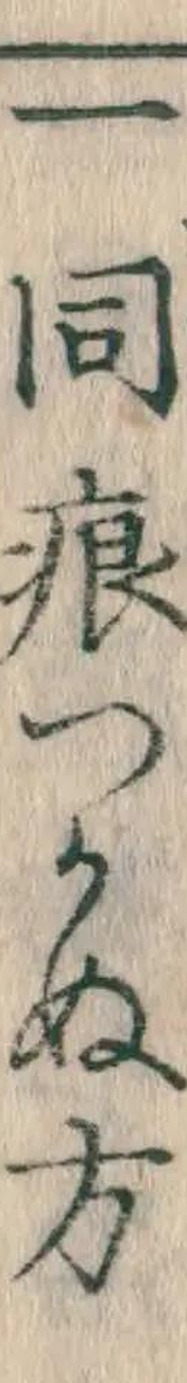一同痕つかぬ方
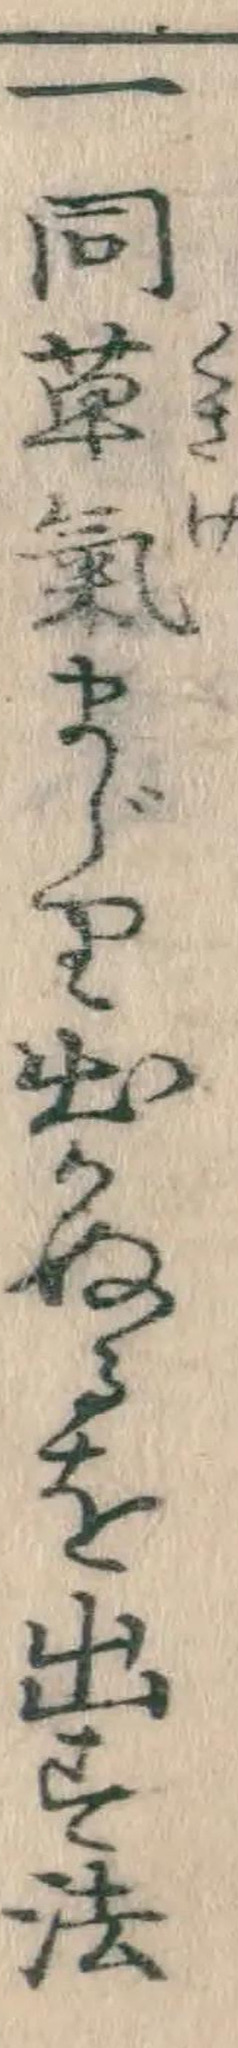一同草気まじり出かぬるを出す法
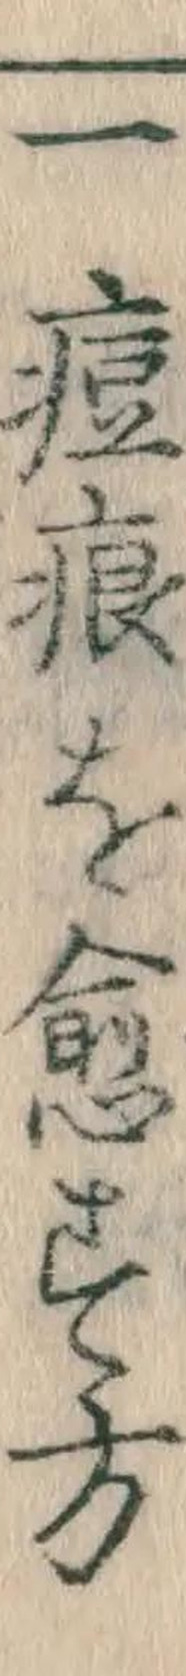一痘痕を愈す方
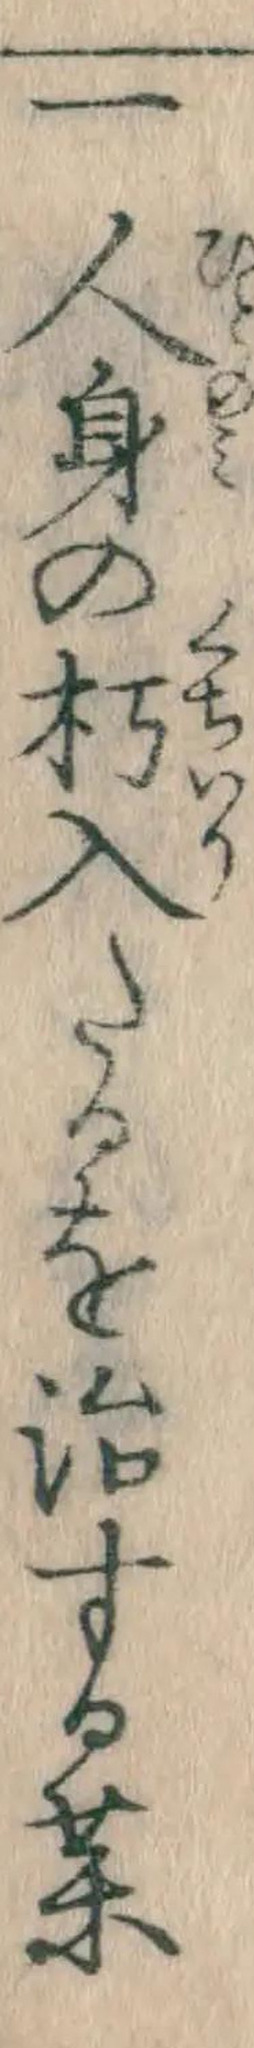一人身の朽入たるを治する薬
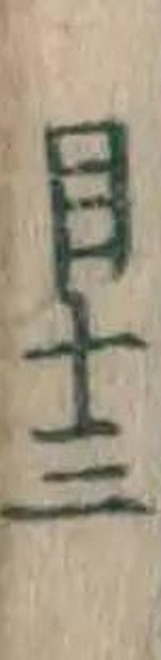目十三

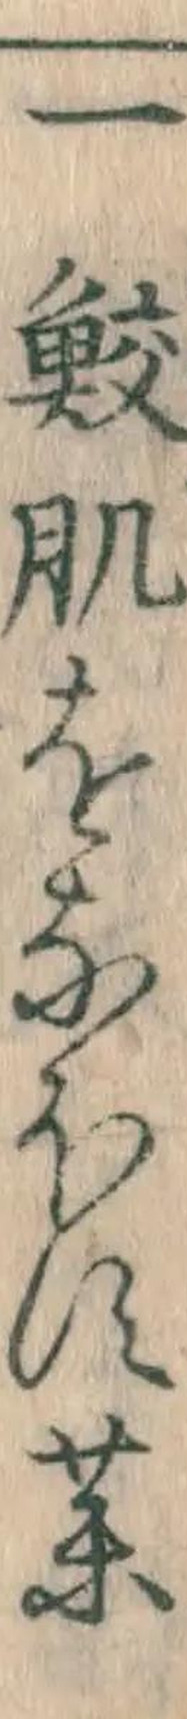一鮫肌をなほす薬
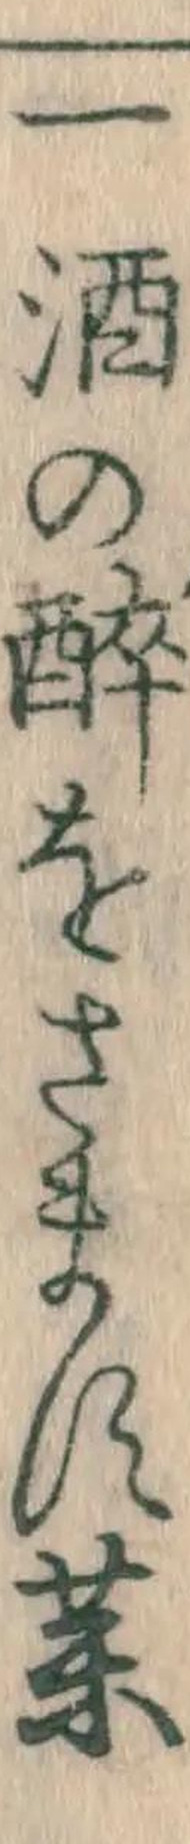一酒の酔をさます薬
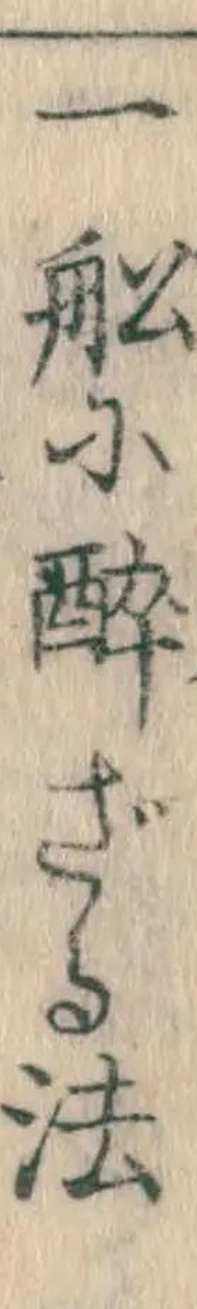一船に酔ざる法
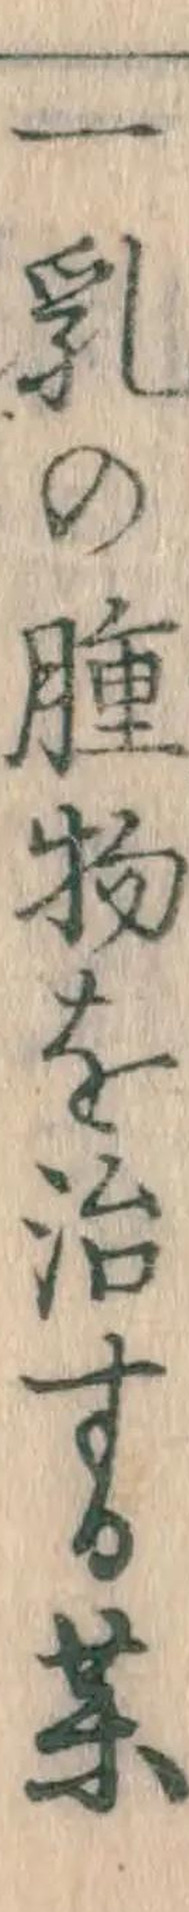一乳の腫物を治する薬
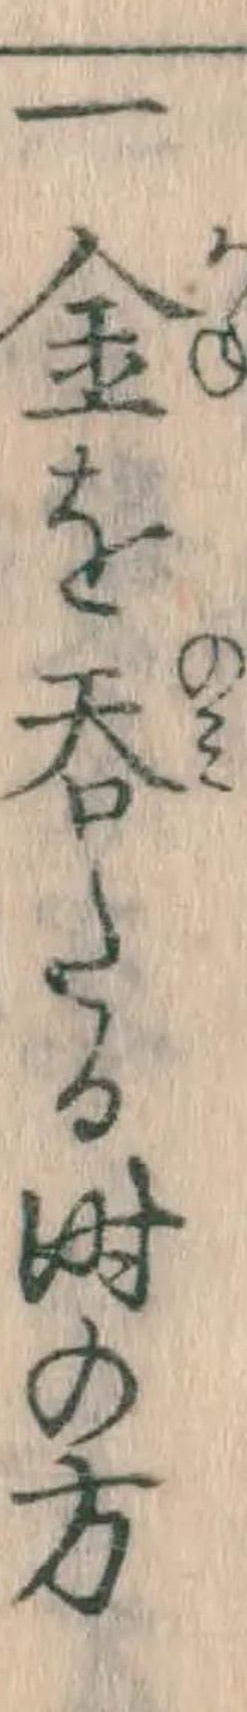一金を呑たる時の方
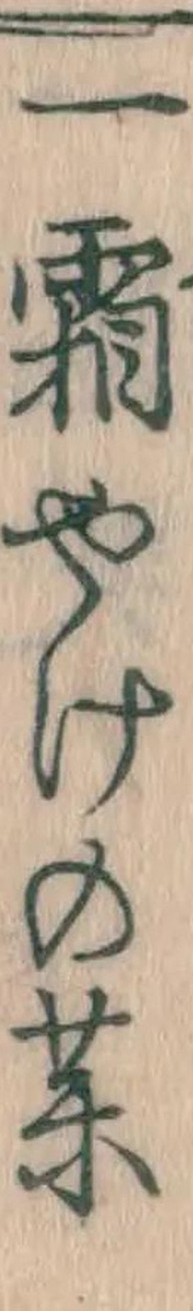一霜やけの薬
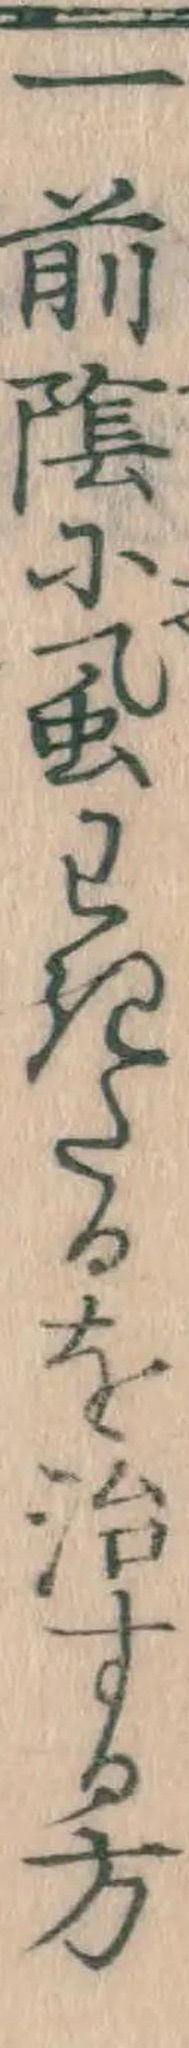一前陰に虱わきたるを治する方
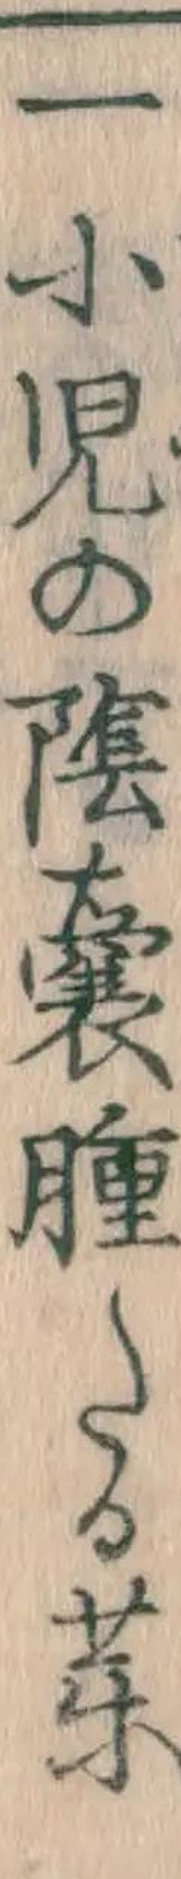一小児の陰嚢腫たる薬
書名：広益秘事大全 3巻. [1]
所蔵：国立国会図書館 National Diet Library, JAPAN
